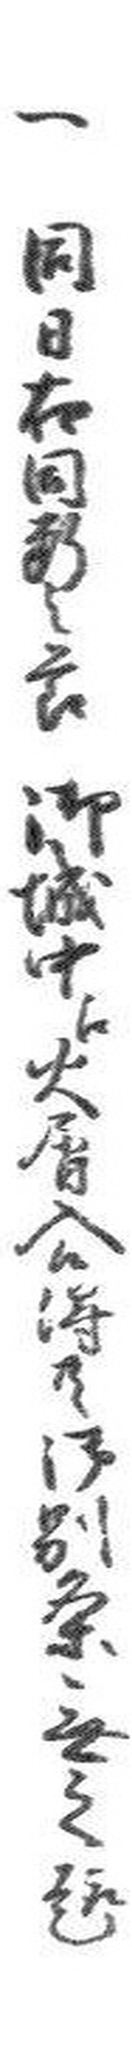一同日右同断之節御城中江火屑入候得共御別条無之趣
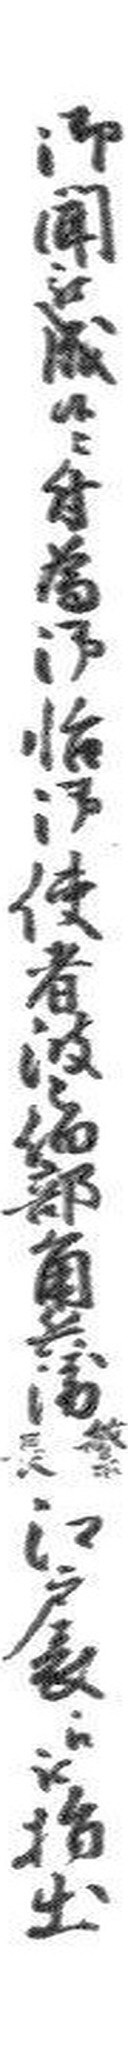御聞被成候ニ付為御怡御使者波々伯部角兵衛繁長江戸表江被指出
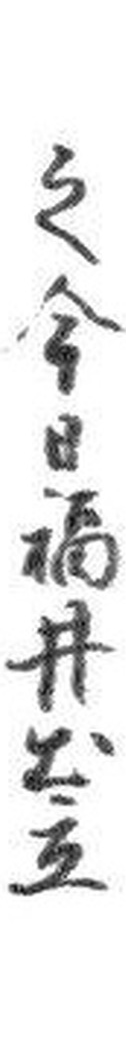之今日福井出立
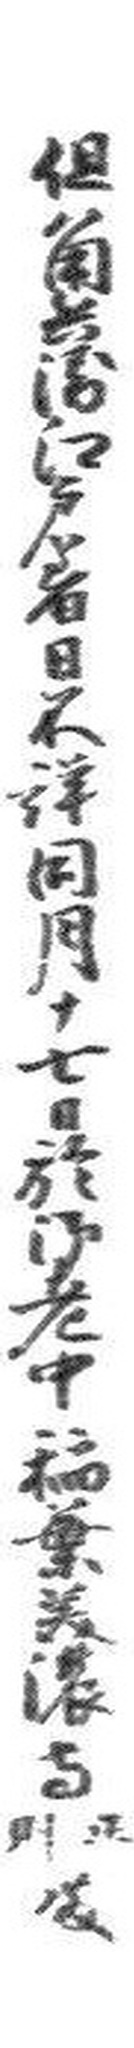但角兵衛江戸着日不詳同月十七日於御老中稲葉美濃守正則殿
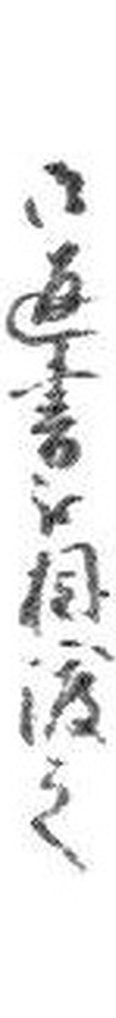御返書被相渡之
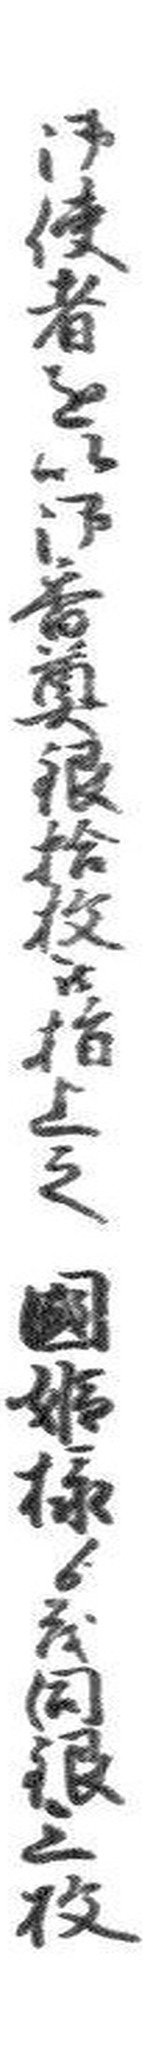御使者を以御香奠銀拾枚被指上之国姫様ゟも同銀三枚
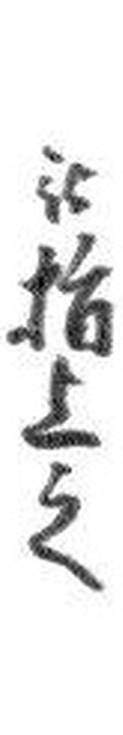被指上之
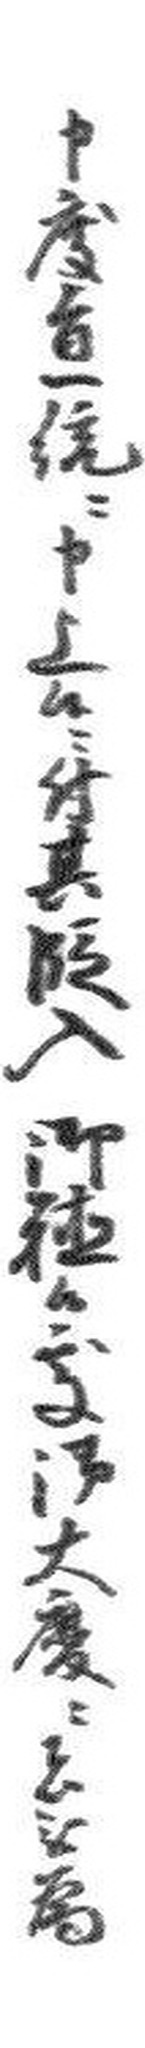申度旨一統ニ申上候ニ付其段入御聴候処御大慶ニ者被為

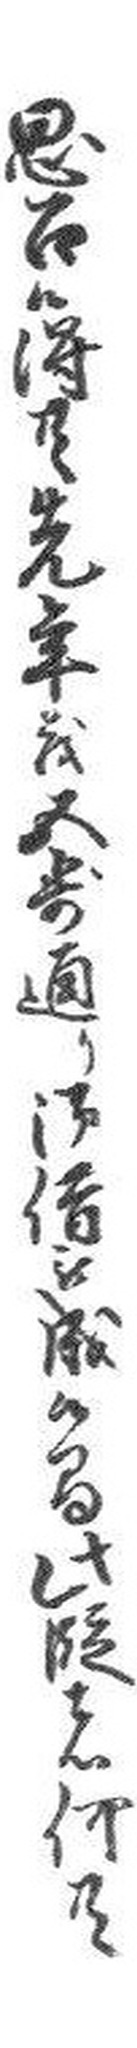思召候得共先年も五歩通リ御借被成候間此段者何共
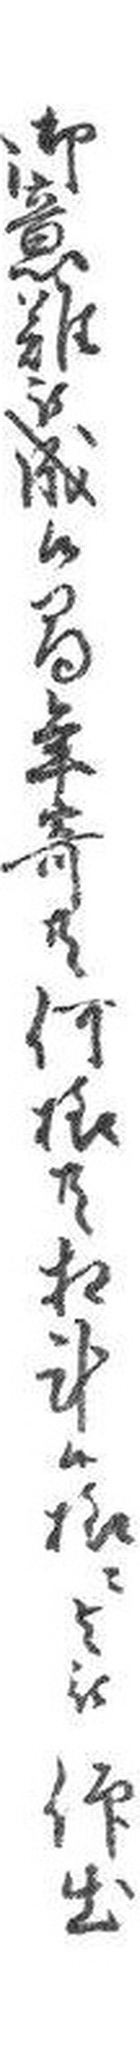御意難被成候間年寄共何様共相計候様ニと被仰出
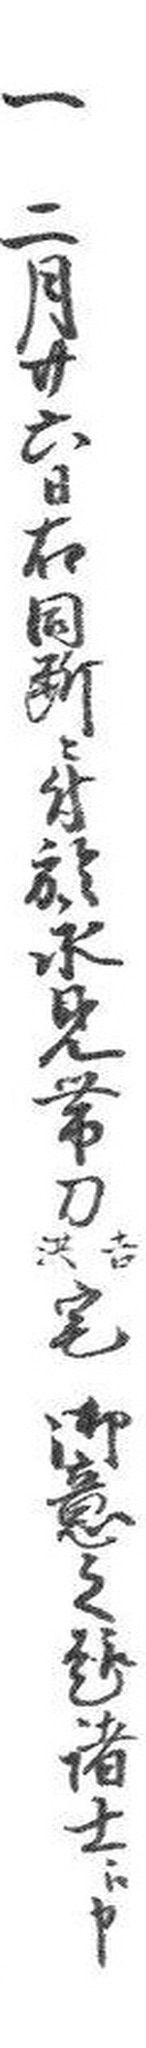一二月廿六日右同断ニ付於永見帯刀吉洪宅御意之趣諸士江申
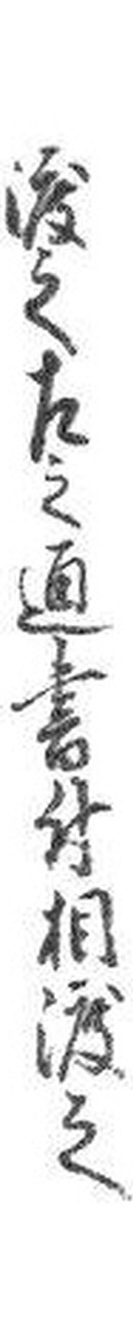渡之左之通書付相渡之
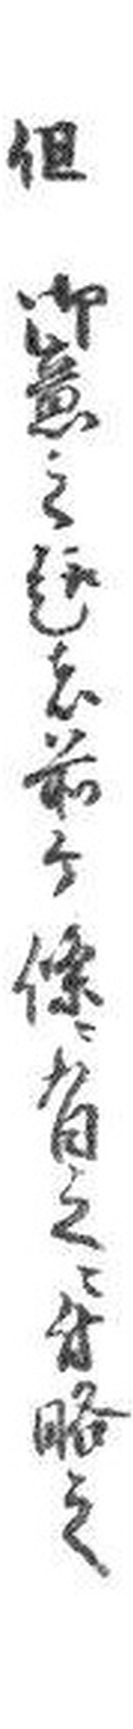但御意之趣者前ケ条ニ有之ニ付略之
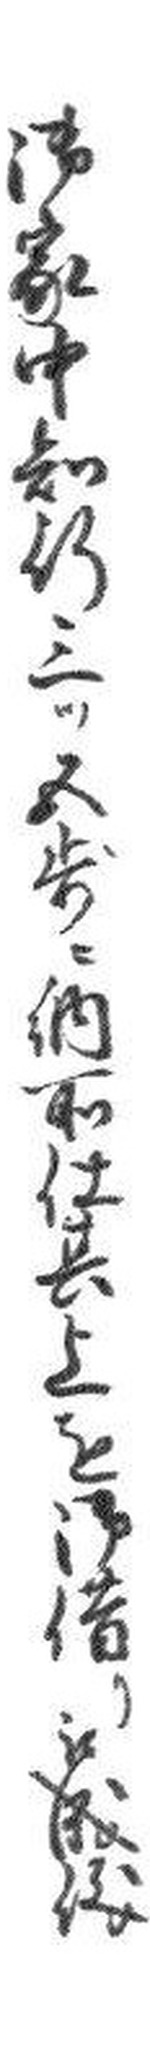御家中知行三ツ五歩ニ納所仕其上を御借リ被成儀
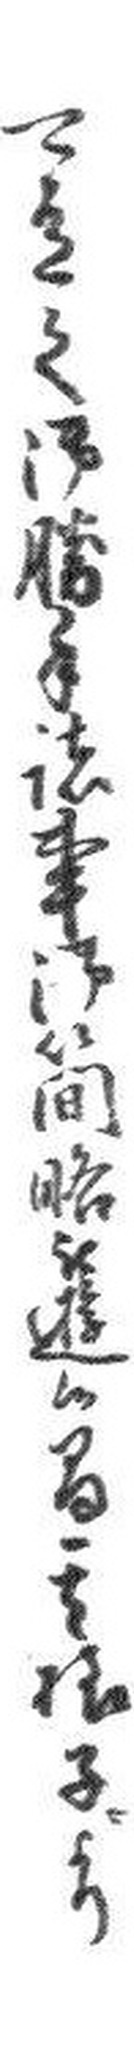可有之御勝手諸事御簡略被遊候間其様子ニより
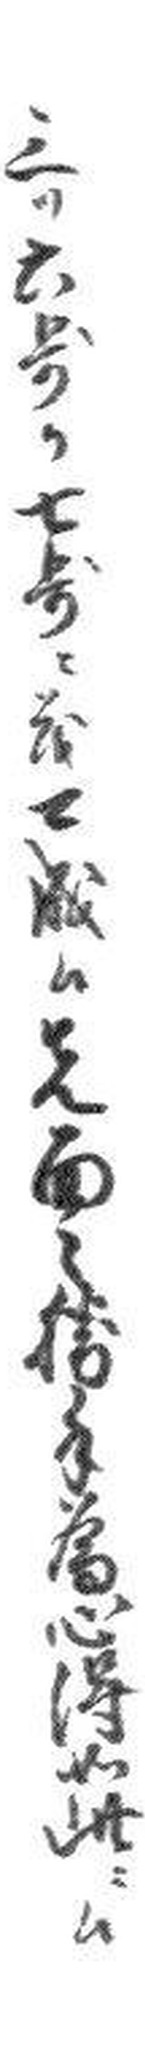三ツ六歩か七歩ニも可成候先面々勝手為心得如此ニ候
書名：家譜 七 光通公 従寛文四年到同九年
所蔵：福井県文書館 Fukui Prefectural Archives
